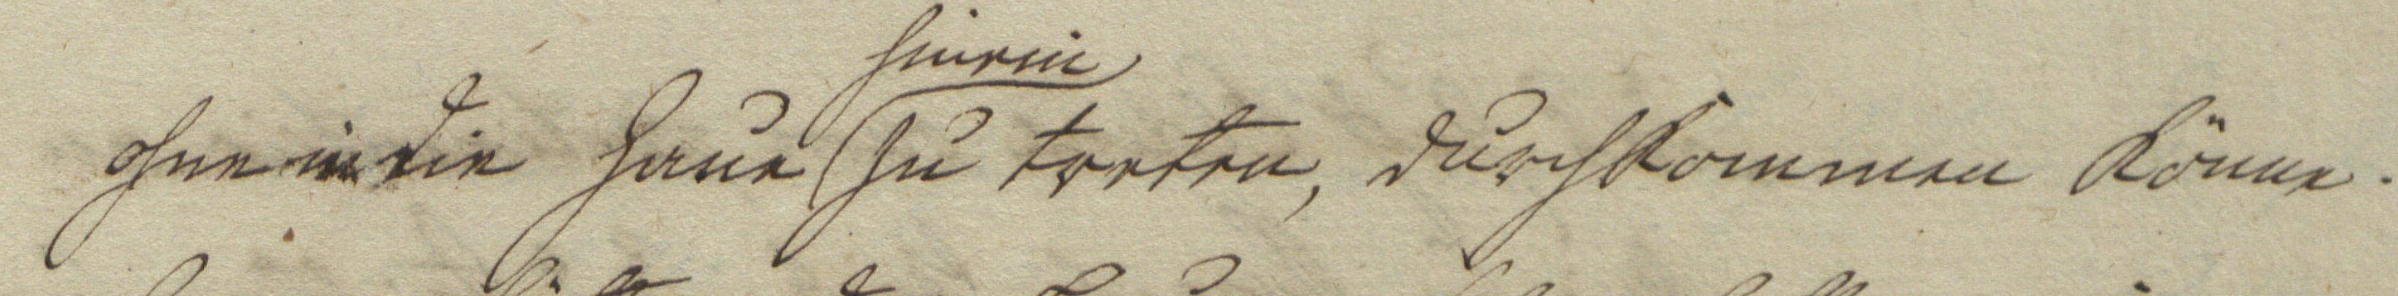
ohne in die Haue hinein zu treten, durchkommen könne.
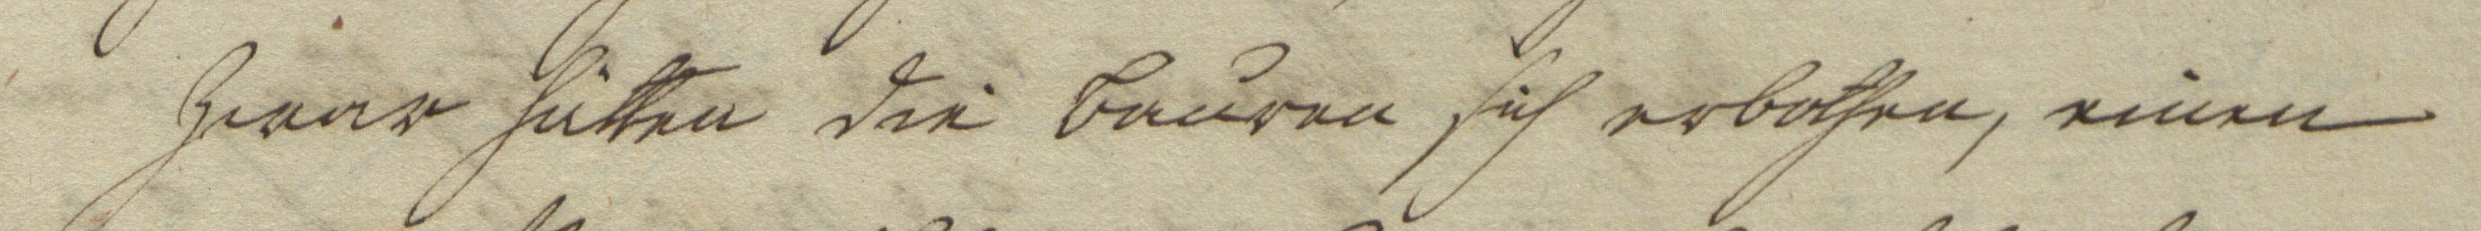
Zwar hätten die Bauren sich erbothen, einen
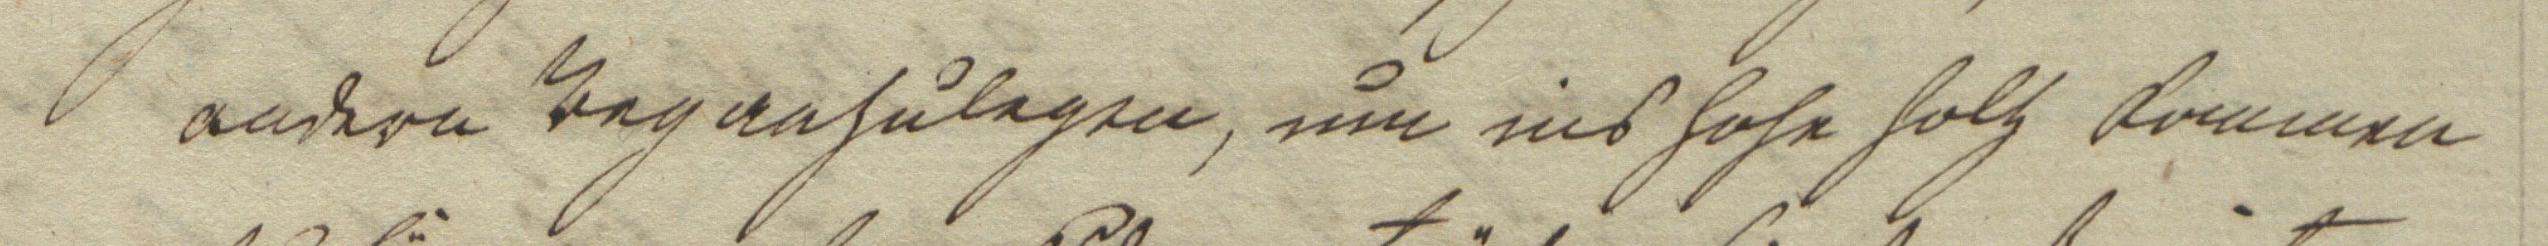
andern Weg anzulegen, um ins hohe Holz kommen
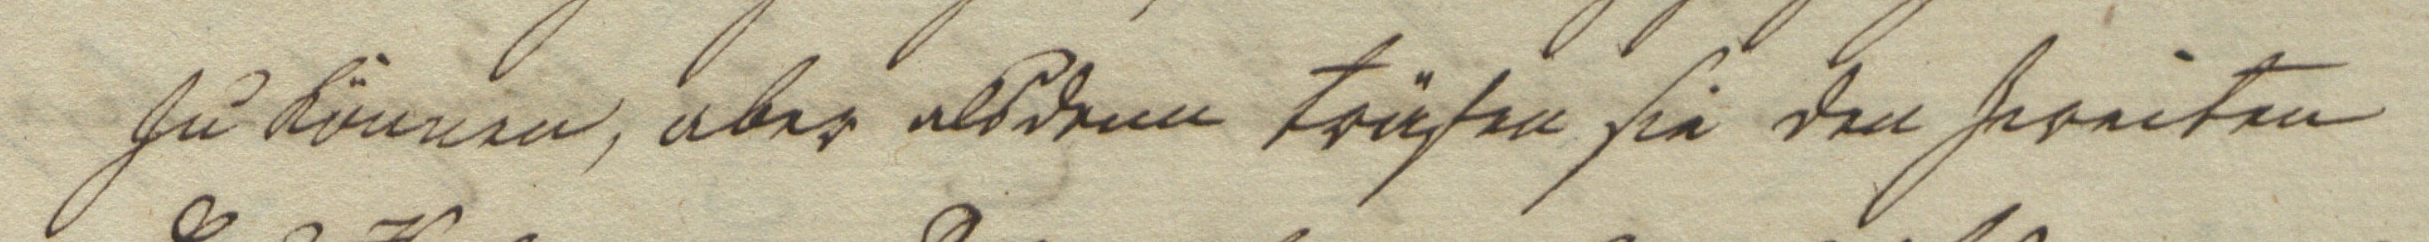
zu können, aber alsdenn träfen sie den zweiten
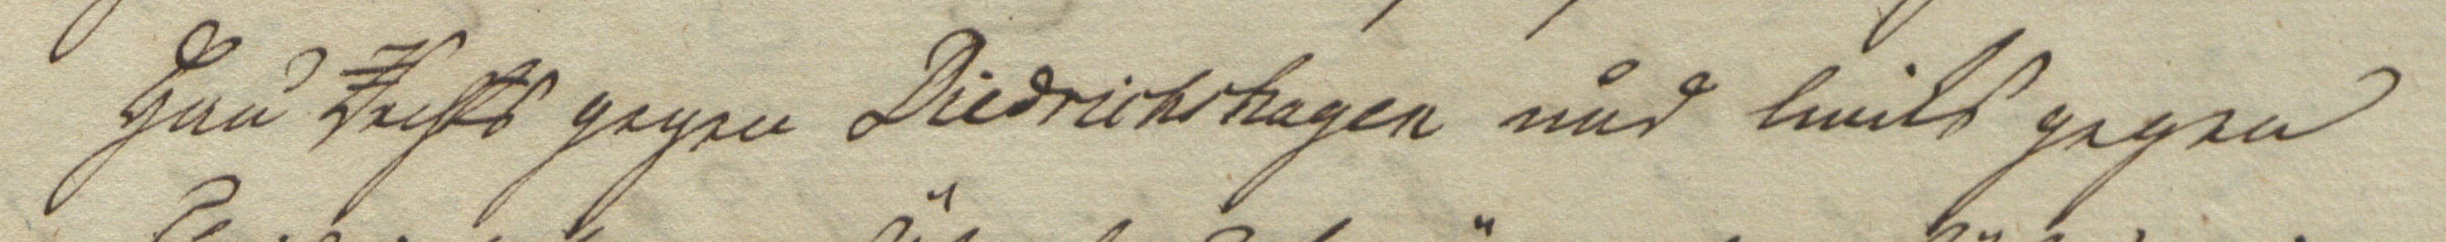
Hau Rechts gegen Diedrichshagen und links gegen
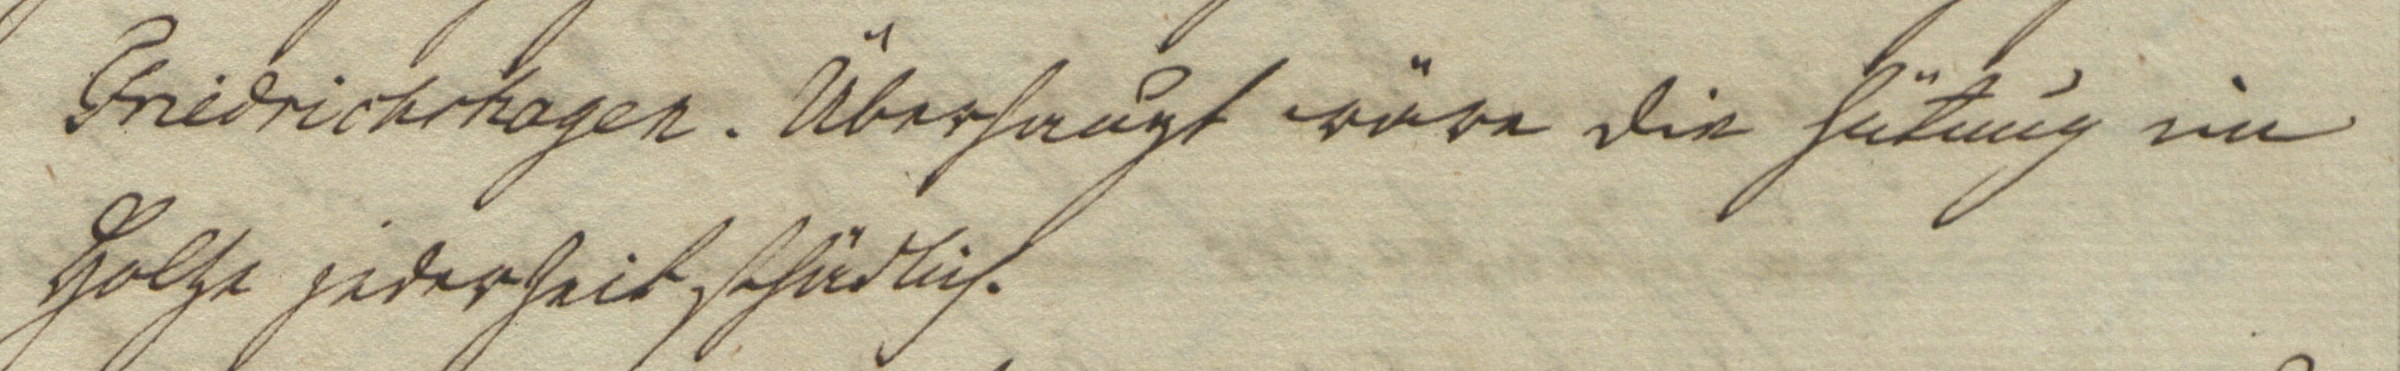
Friedrichshagen. Überaupt wäre die Hütung im
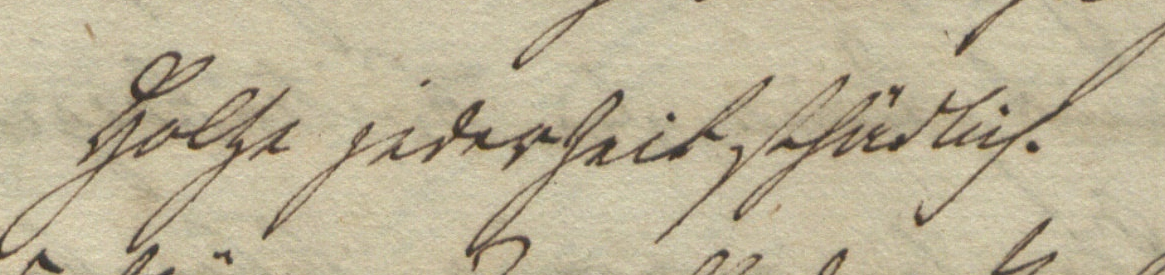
Holze jederzeit schädlich.
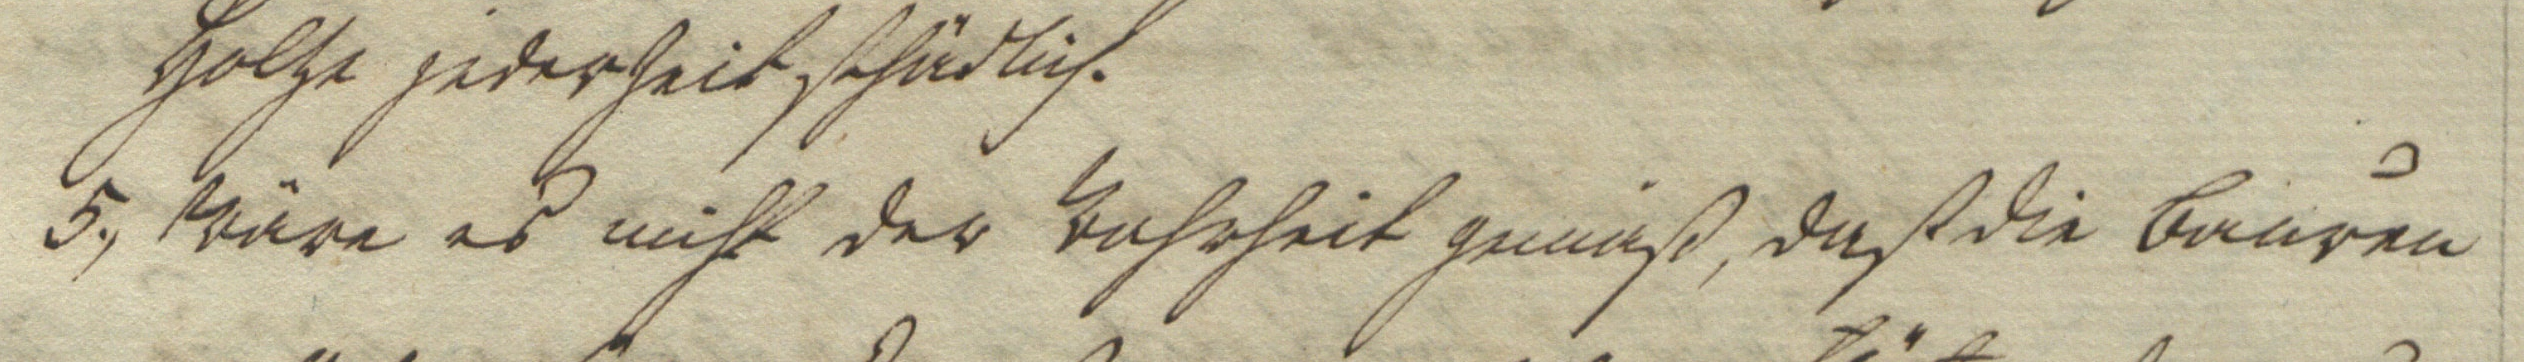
5., Wäre es nicht der Wahrheit gemäß, daß die Bauren
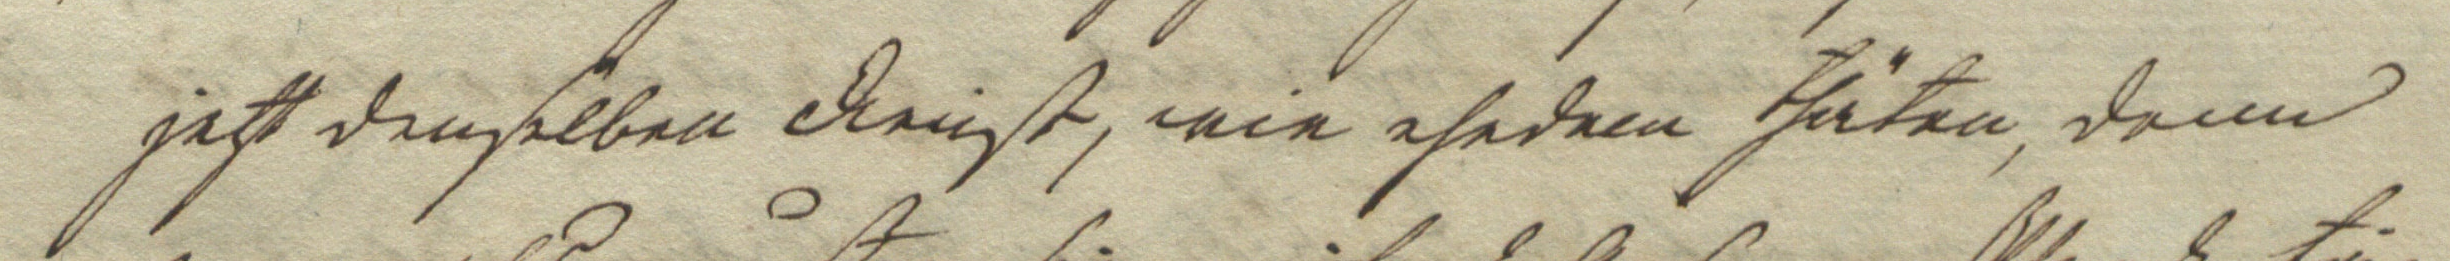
jetzt denselben Dienst, wie ehedem thäten, denn
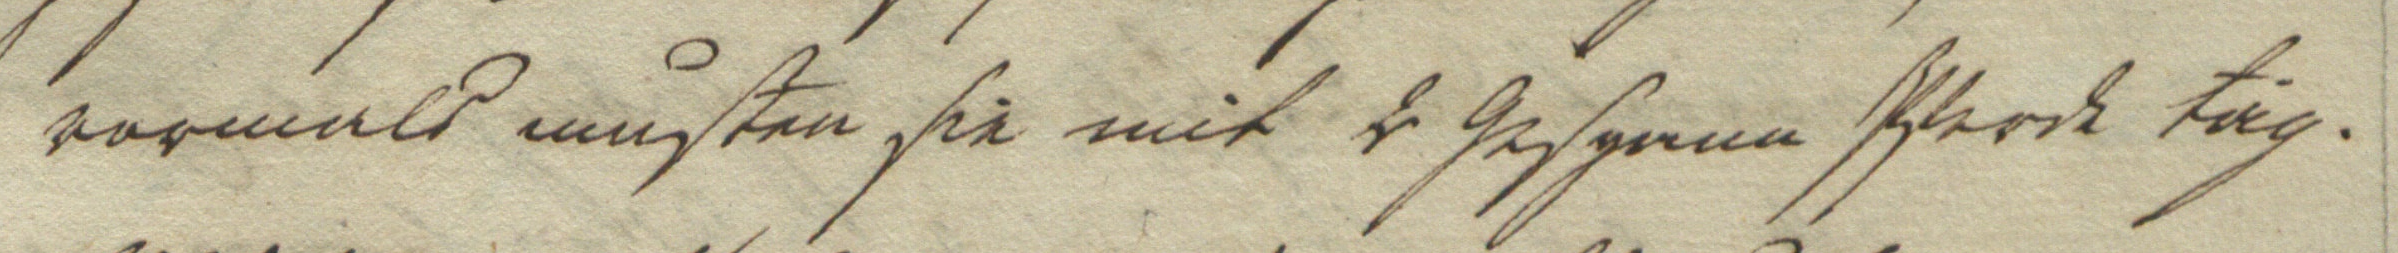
vormals mußten sie mit 2 Gespannen Pferd täg¬
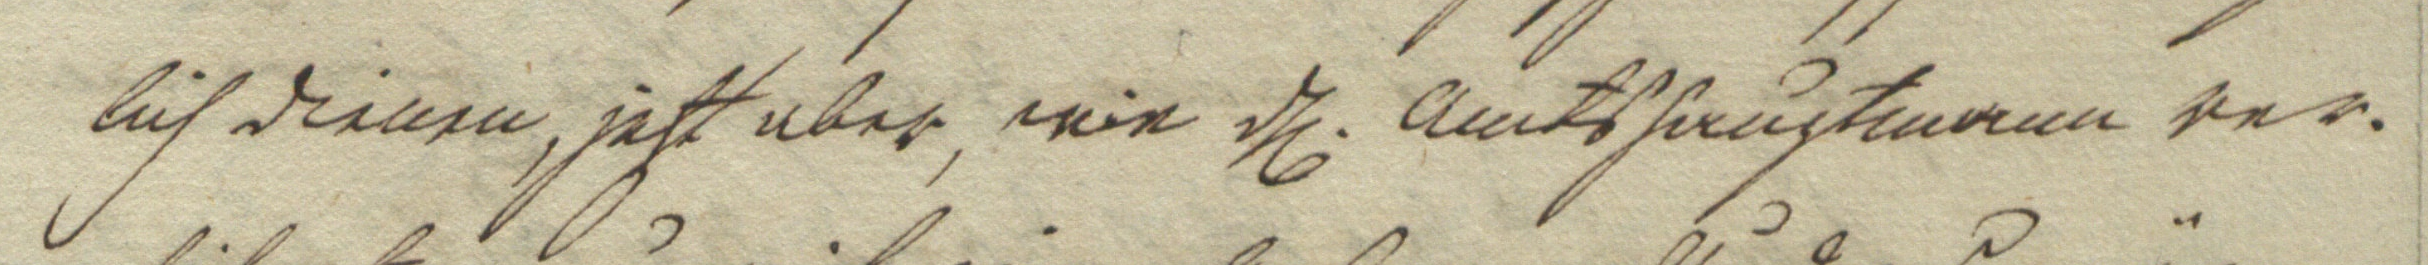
lich dienen, jetzt aber, wie dh. Amtshauptmann ver¬
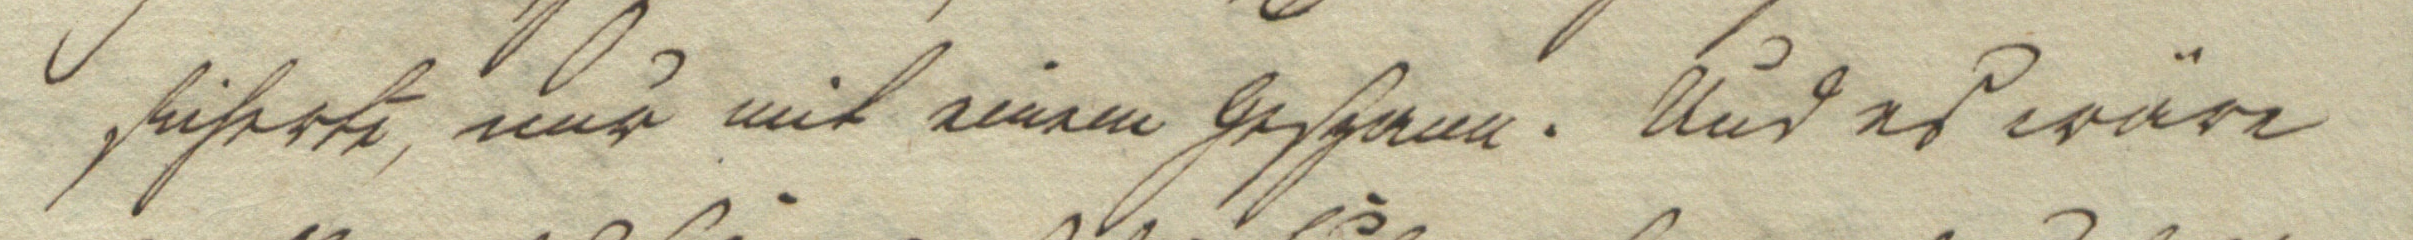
sicherte, nur mit einem Gespann. Und es wäre
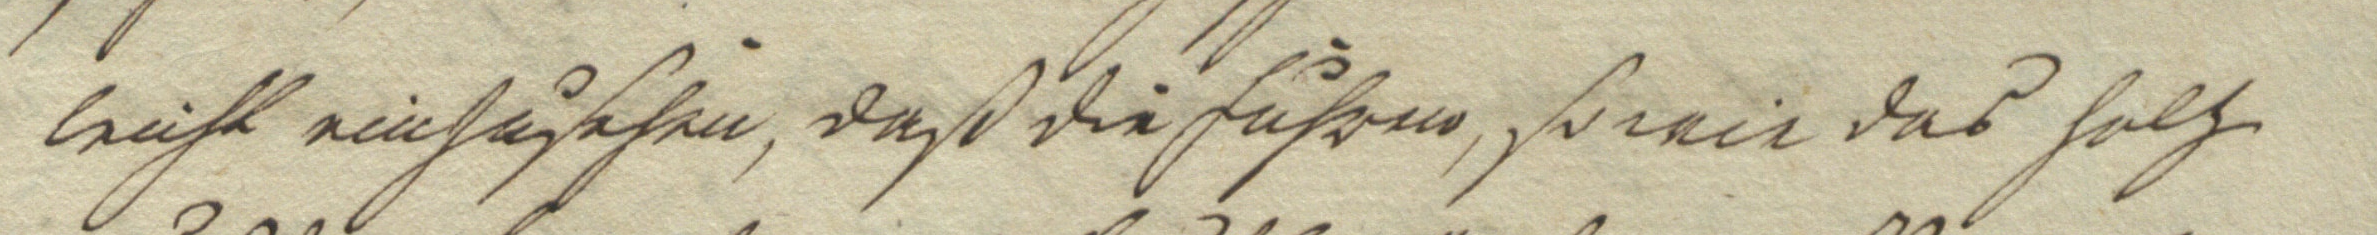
leicht einzusehen, daß die Fuhren, so wie das Holz
